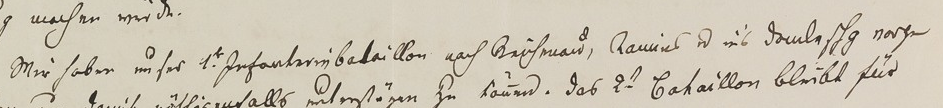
Wir haben unser 1ts Infanteriebataillon nach Reichenau, Tamins und in's Domleschg vorge-
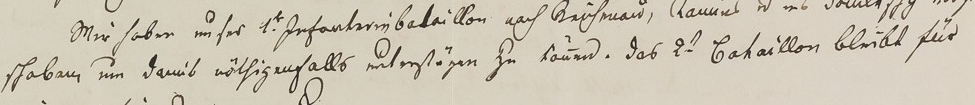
schoben, um damit nöthigenfalls unterstüzen zu können. Das 2te Bataillon bleibt für
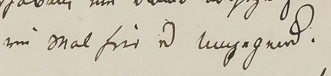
ein Mal hier u Umgegend.
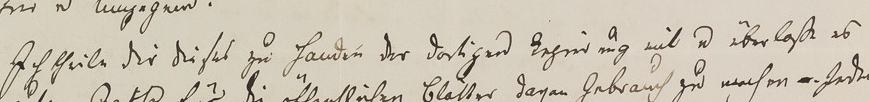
Ich theile dir dieses zu Handen der dortigen Regierung mit u überlaße es
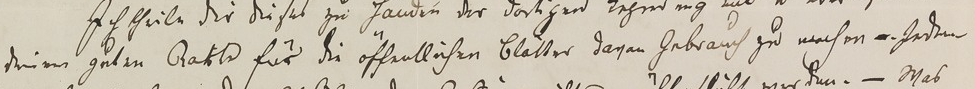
deinem guten Takte für die öffentlichen Blätter davon Gebrauch zu machen. – Jeden-
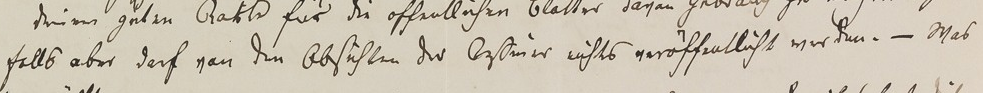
falls aber darf von den Absichten der Tessiner nichts veröffentlicht werden. – Was
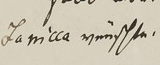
Lanicca wünschte.
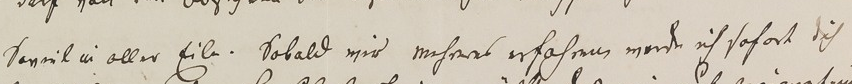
Soviel in aller Eile. Sobald wir mehreres erfahren, werde ich sofort dich
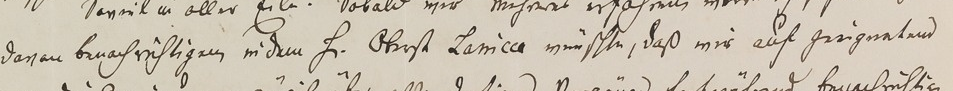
davon benachrichtigen, indem H. Oberst Lanicca wünschte, daß wir auf geeignetem
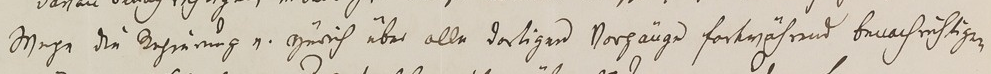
Wege die Regierung v. Zürich über alle dortigen Vorgänge fortwährend benachrichtigen
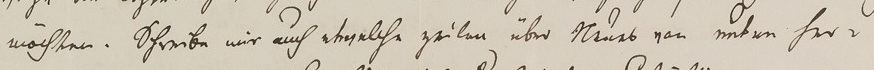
möchten. Schreibe mir auch etwelche Zeilen über Neues von unten her.
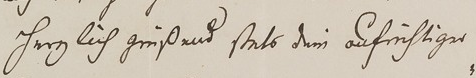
Herzlich grüßend stets dein aufrichtiger
